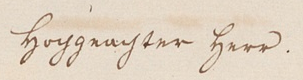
Hochgeachteter Herr.
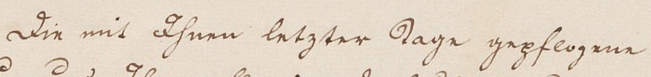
Die mit Ihnen letzter Tage gepflogene
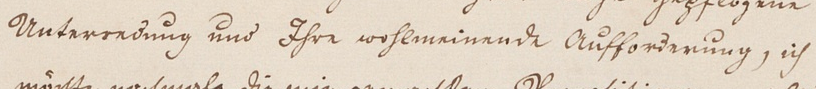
Unterredung und Ihre wohlmeinende Aufforderung, ich
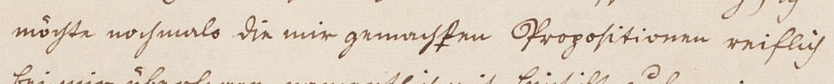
möchte nochmals die mir gemachten Propositionen reiflich
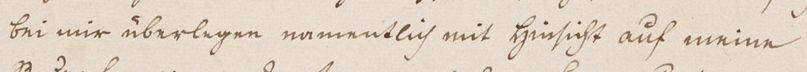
bei mir überlegen namentlich mit Hinsicht auf meine
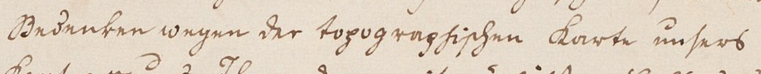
Bedenken wegen der topographischen Karte unsers
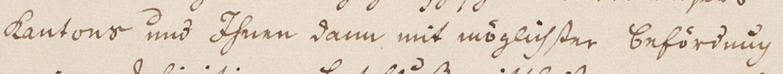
Kantons und Ihnen dann mit möglichster Beförderung
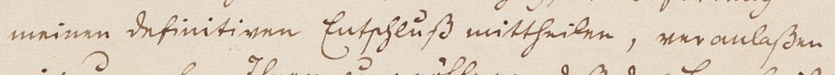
meinen definitiven Entschluß mittheilen, veranlaßen
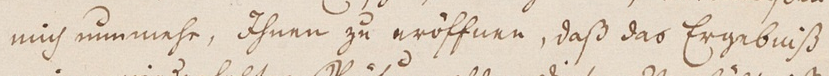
mich nunmehr, Ihnen zu eröffnen, daß das Ergebniß
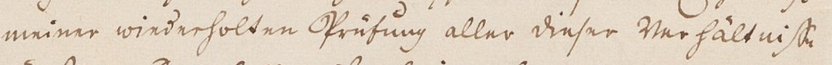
meiner wiederholten Prüfung aller dieser Verhältnisse
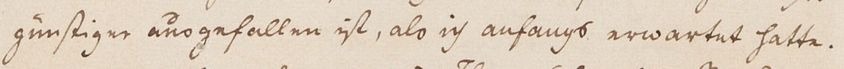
günstiger ausgefallen ist, als ich anfangs erwartet hatte.
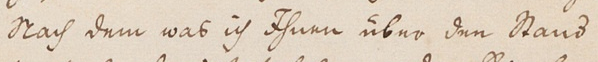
Nach dem was ich Ihnen über den Stand
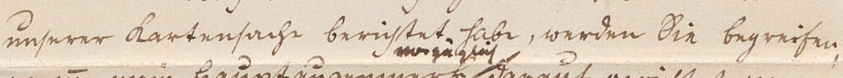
unserer Kartensache berichtet habe, werden Sie begreifen,
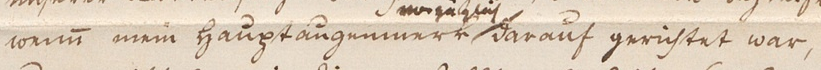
wenn mein Hauptaugenmerk vorzüglich darauf gerichtet war,
